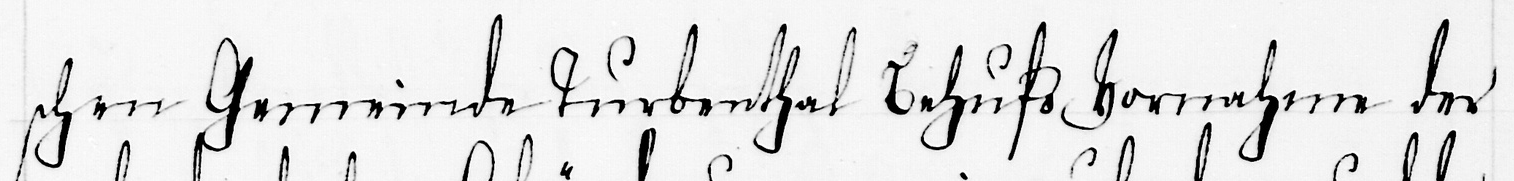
schen Gemeinde Turbenthal Behufs Vornahme der
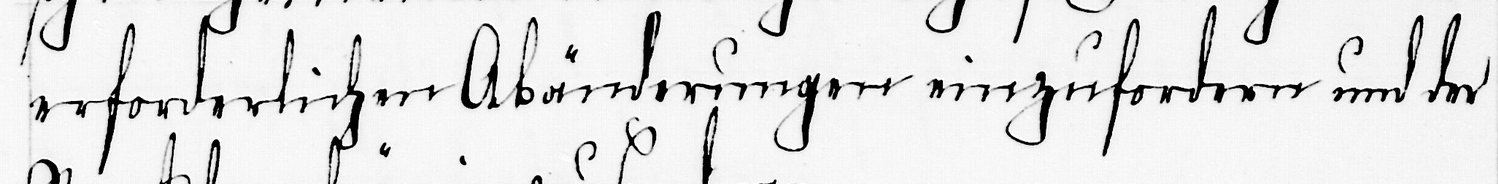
erforderlichen Abänderungen einzufordern und der
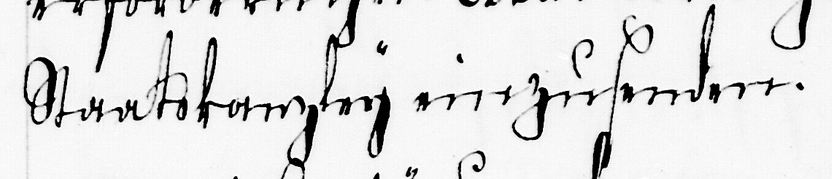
Staatskanzley einzusenden.
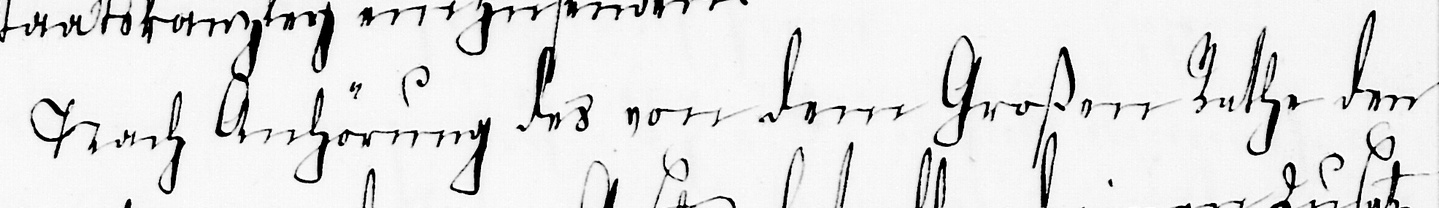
Nach Anhörung des von dem Großen Rathe den
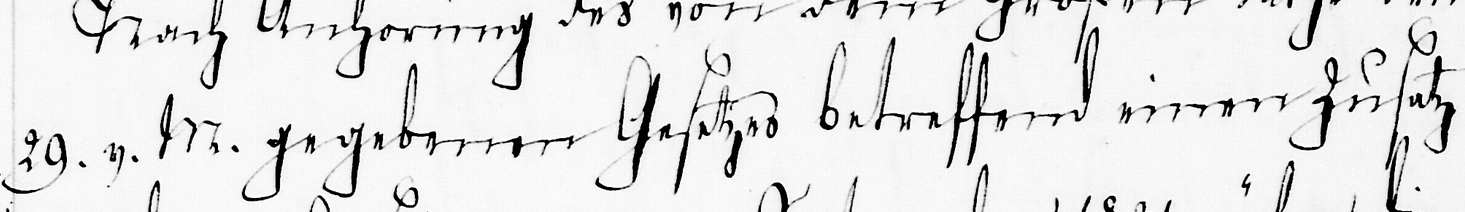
29. v. M. gegebenen Gesetzes betreffend einen Zusatz
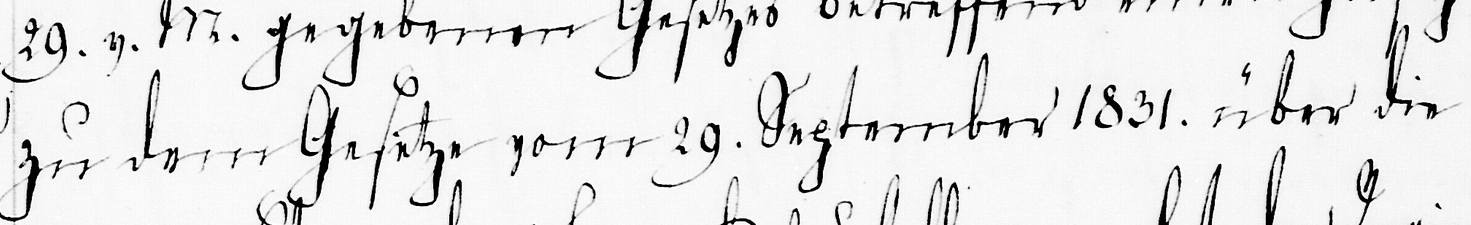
zu dem Gesetze vom 29. September 1831. über die
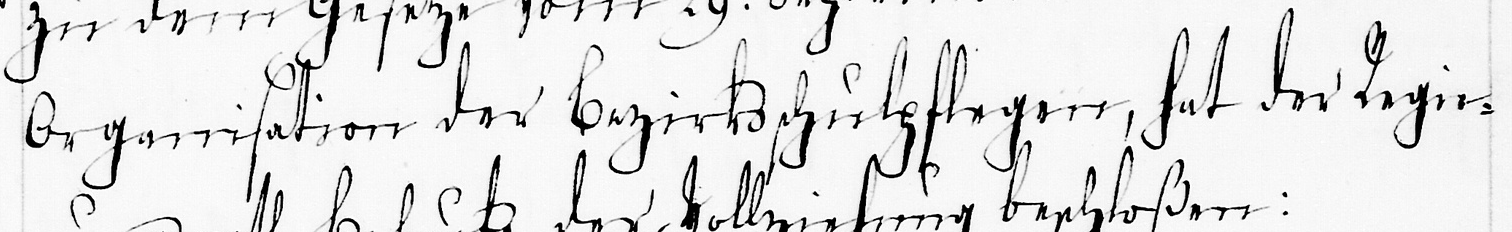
Organisation der Bezirksschulpflegen, hat der Regie¬
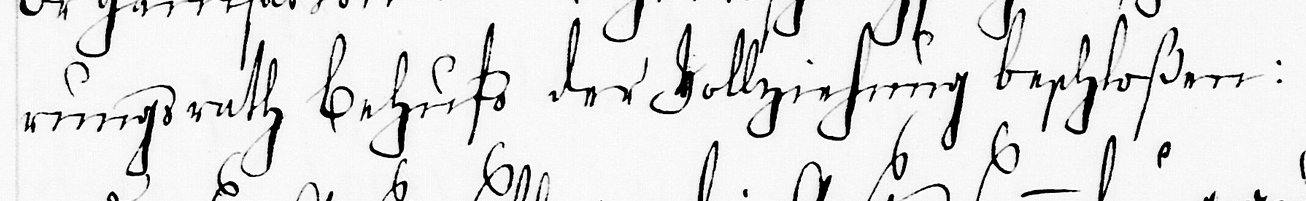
rungsrath Behufs der Vollziehung beschloßen:
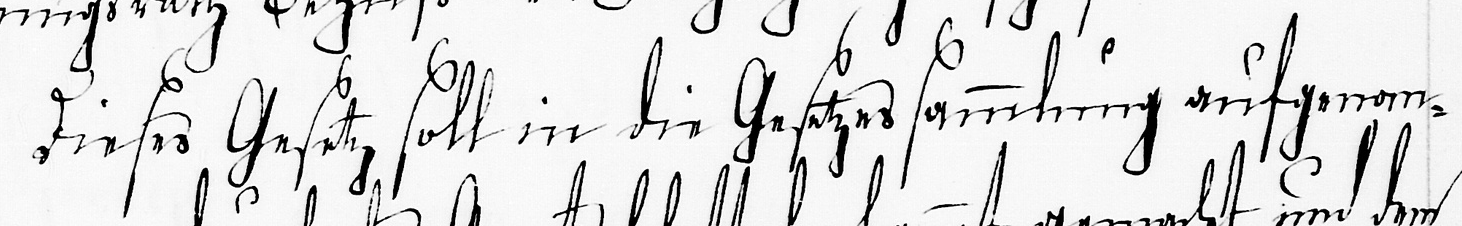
Dieses Gesetz soll in die Gesetzessammlung aufgenom¬
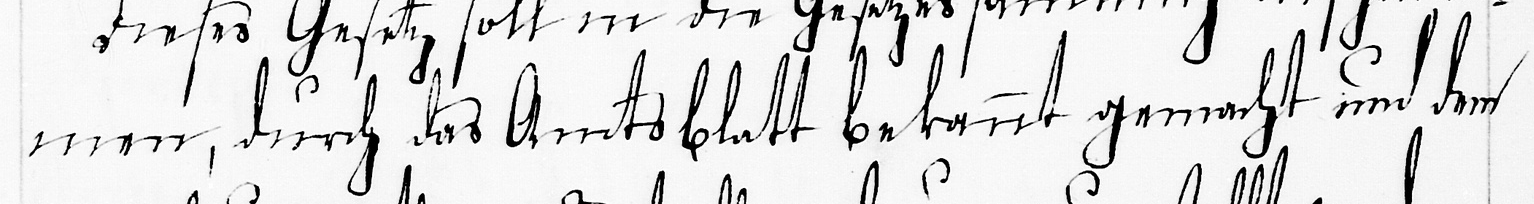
men, durch das Amtsblatt bekannt gemacht und dem
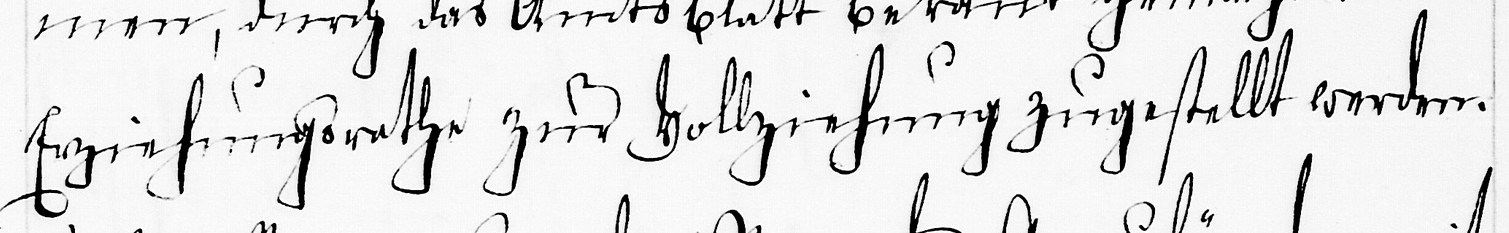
Erziehungsrathe zur Vollziehung zugestellt werden.
